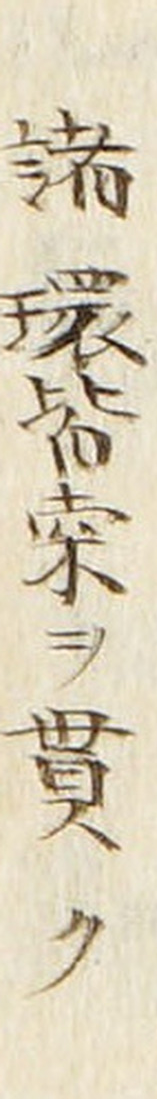諸環皆索ヲ貫ク
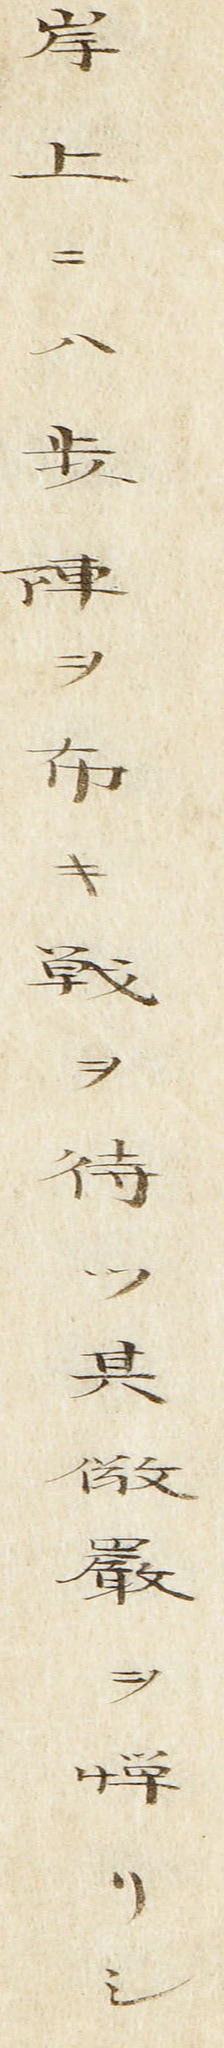岸上ニハ歩陣ヲ布キ戦ヲ待ツ其儆厳ヲ憚リシ
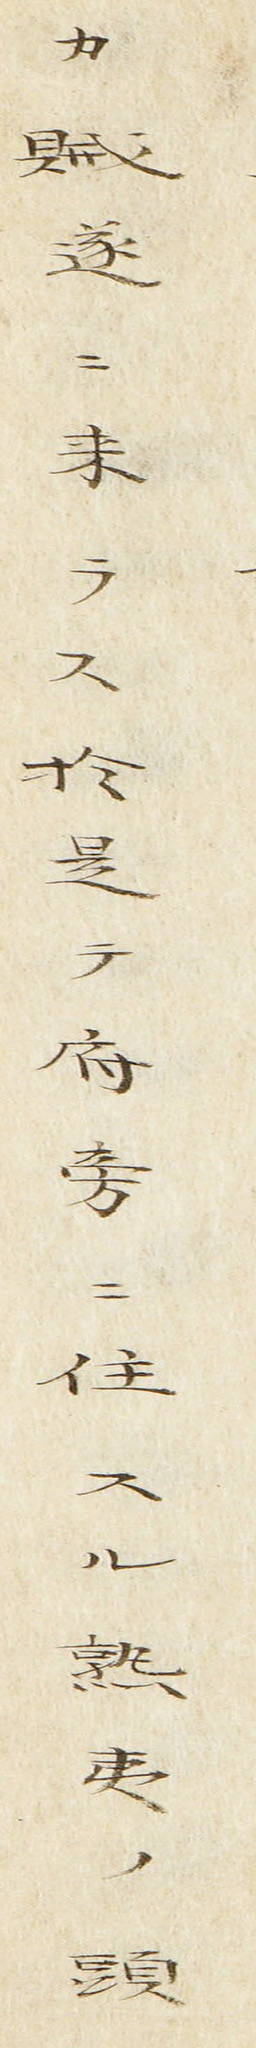カ賊遂ニ来ラス於是テ府旁ニ住スル熟夷ノ頭

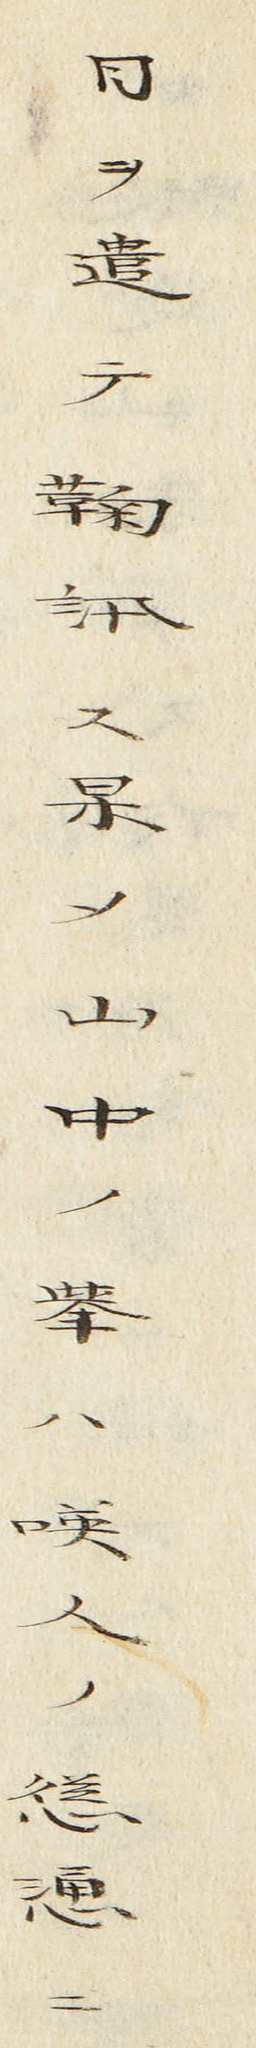目ヲ遣テ鞠訊ス果シテ山中ノ挙ハ人ノ慫慂ニ
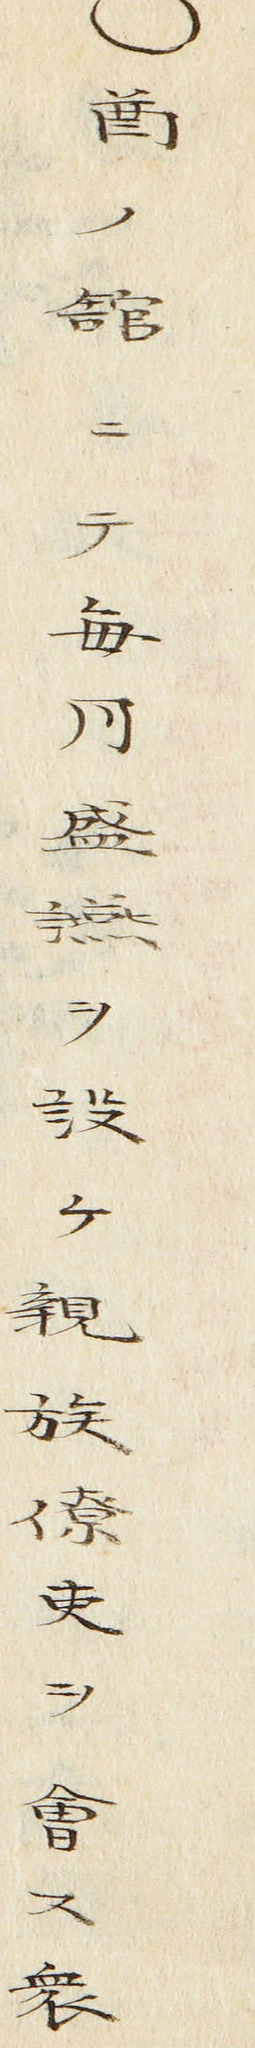〇酋ノ館ニテ毎月盛讌ヲ設ケ親族僚吏ヲ会ス衆
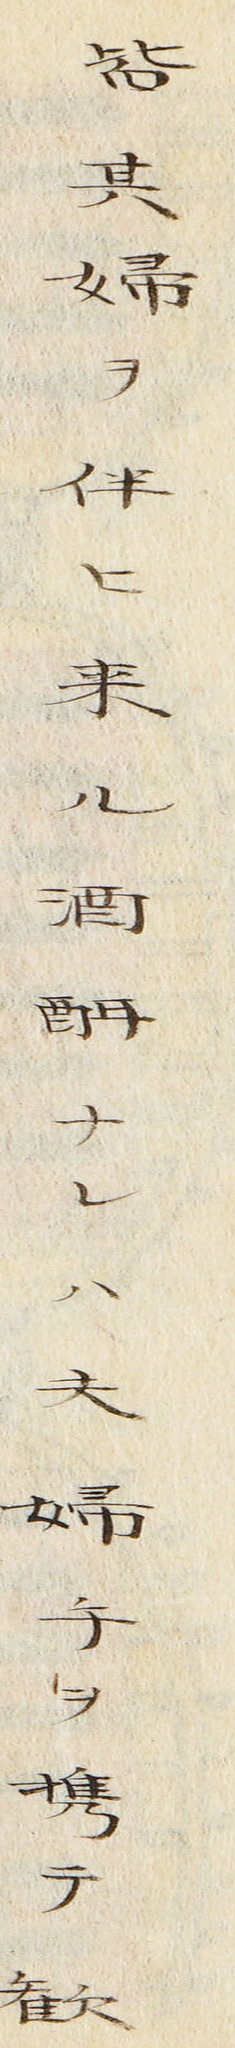皆其婦ヲ伴ヒ来ル酒䣵ナレハ夫婦手ヲ携テ歓
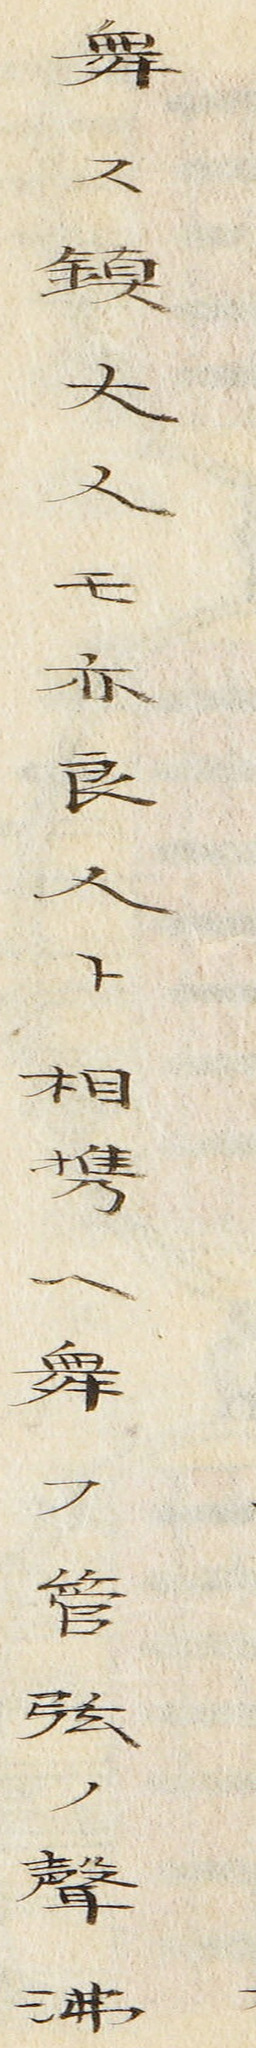舞ス鎮大人モ亦良人ト相携ヘ舞フ管弦ノ声沸
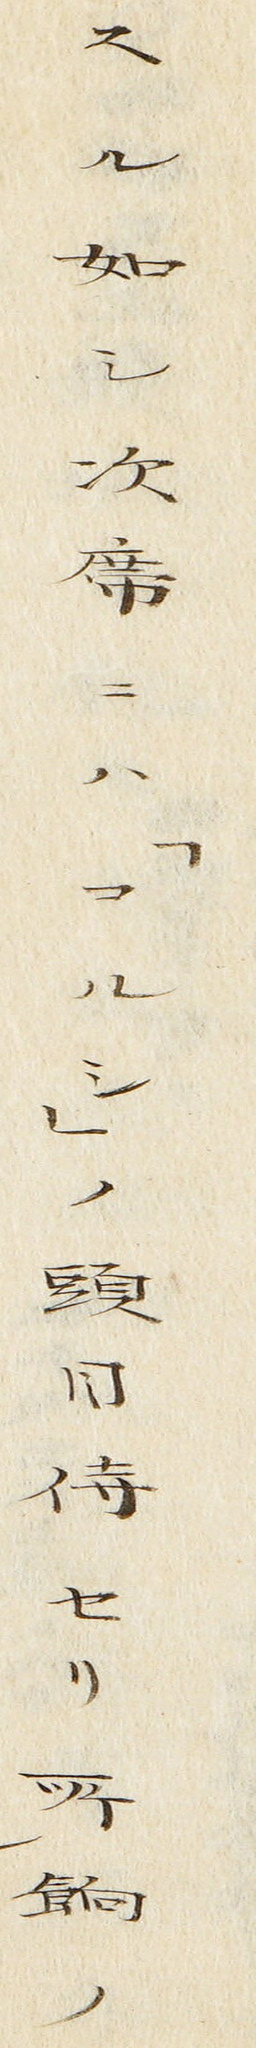スル如シ次席ニハ「コルシ」ノ頭目侍セリ所餉ノ
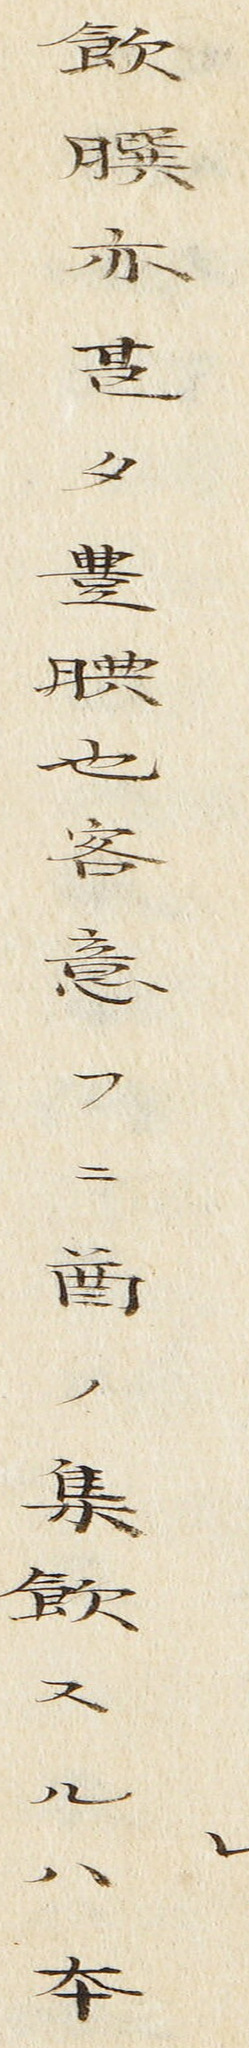飲亦甚タ豊腆也客意フニ酋ノ集飲スルハ本
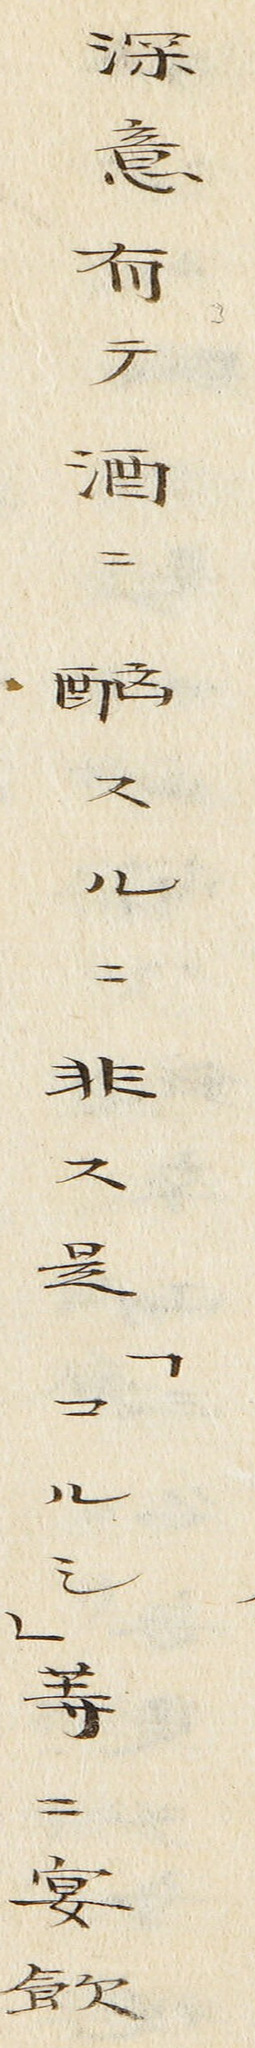深意有テ酒ニスルニ非ス是「コルシ」等ニ宴飲
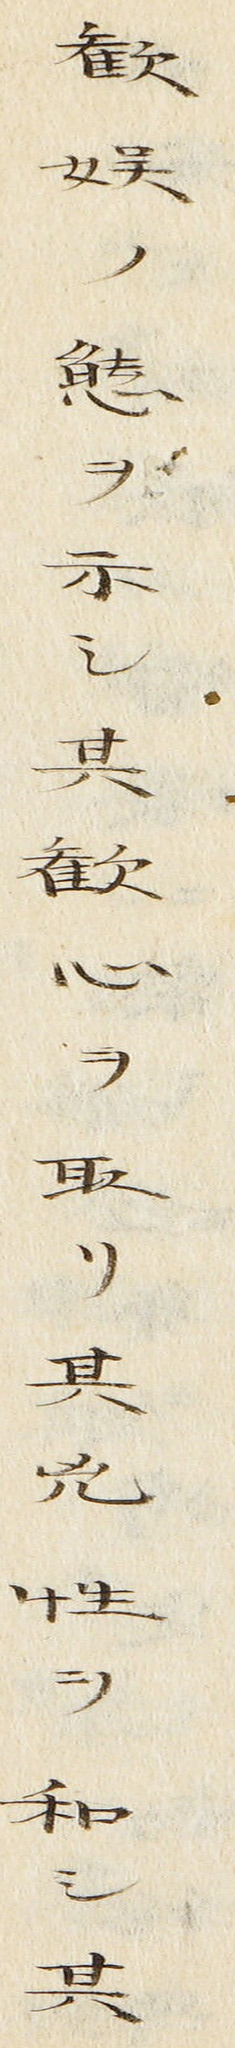歓娯ノ態ヲ示シ其歓心ヲ取リ其凶性ヲ和シ其
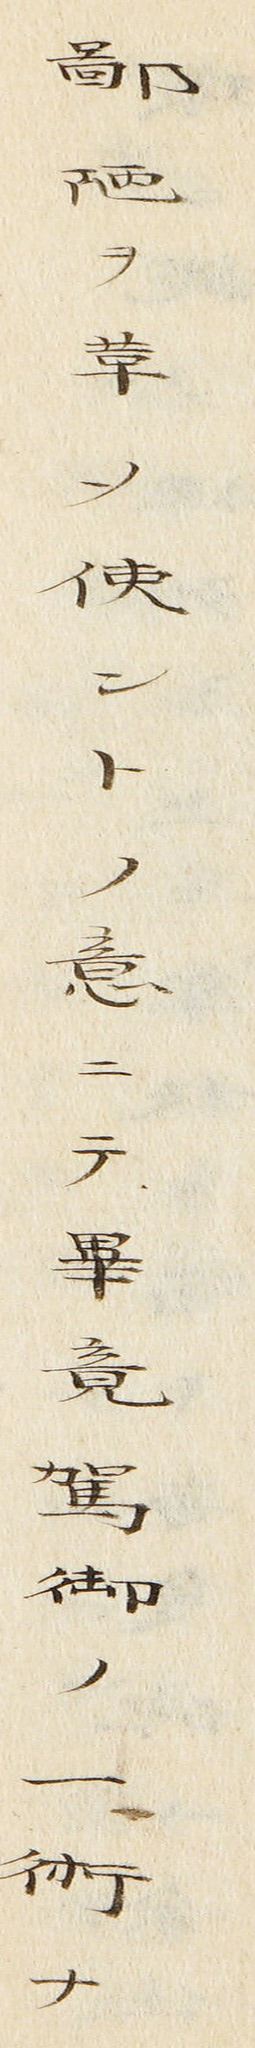鄙陋ヲ革メ使ントノ意ニテ畢竟駕御ノ一術ナ
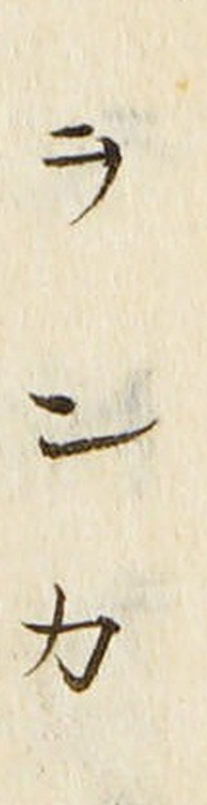ランカ
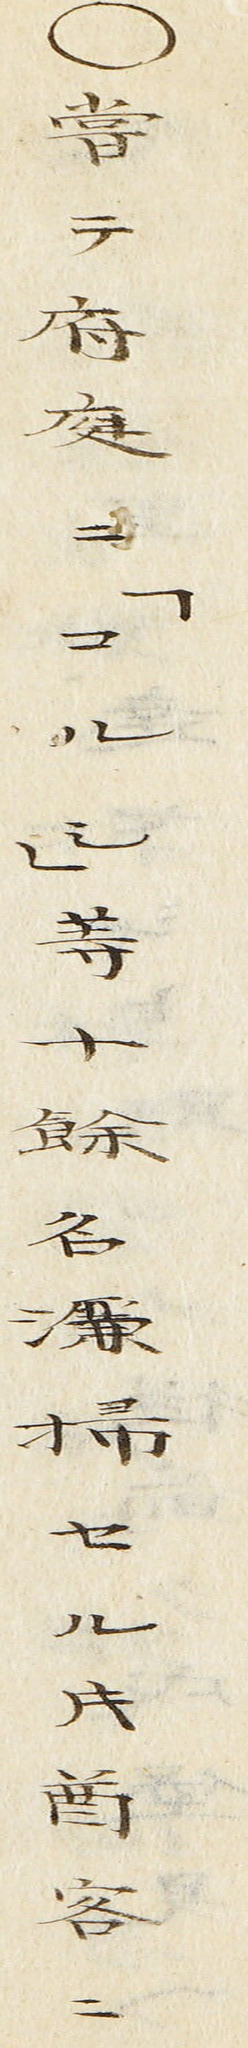〇嘗テ府庭ニ「コルシ」等十余名濂掃セルトキ酋客ニ
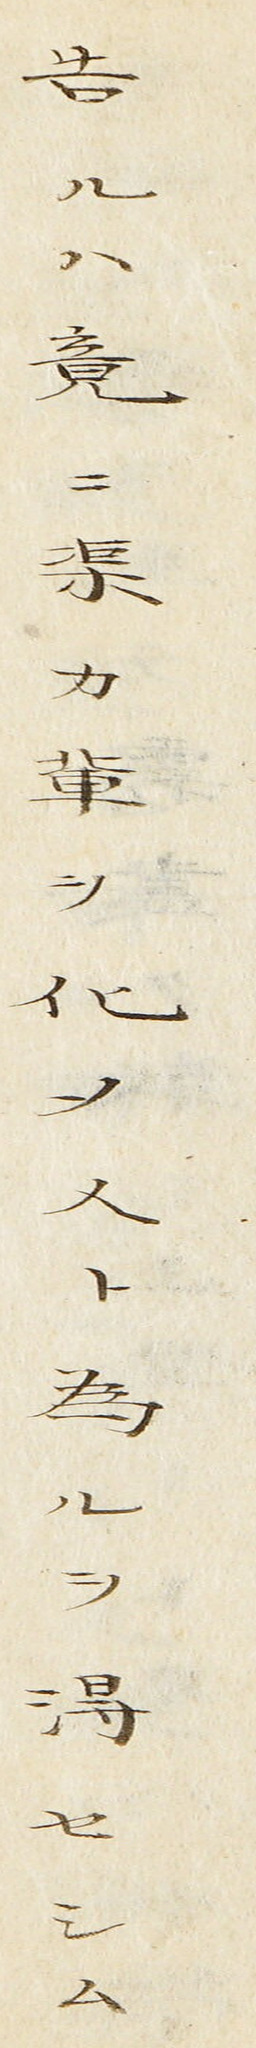告ルハ竟ニ渠カ輩ヲ化シテ人ト為ルヲ得セシム
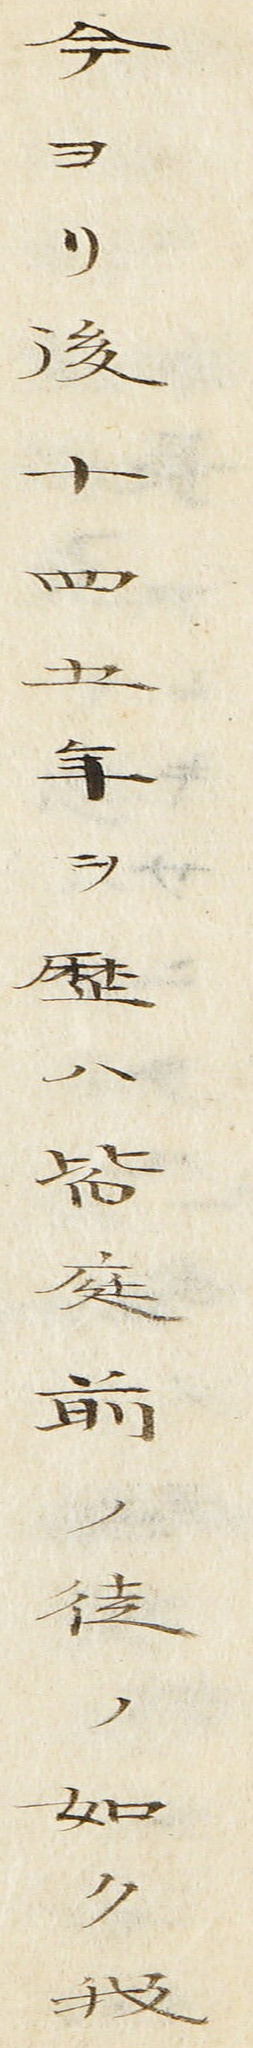今ヨリ後十四五年ヲ歴ハ皆庭前ノ徒ノ如ク我
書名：蕃談
